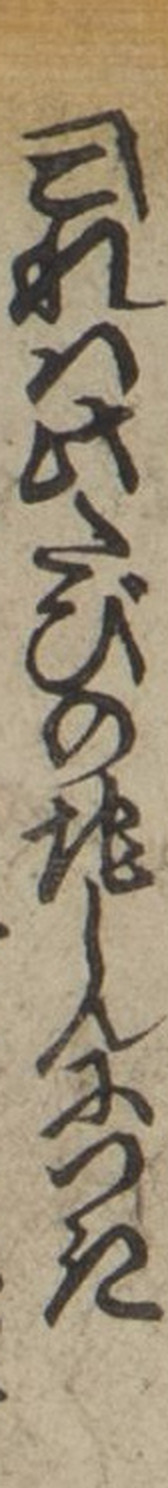〽これは此たびの地しんにつき
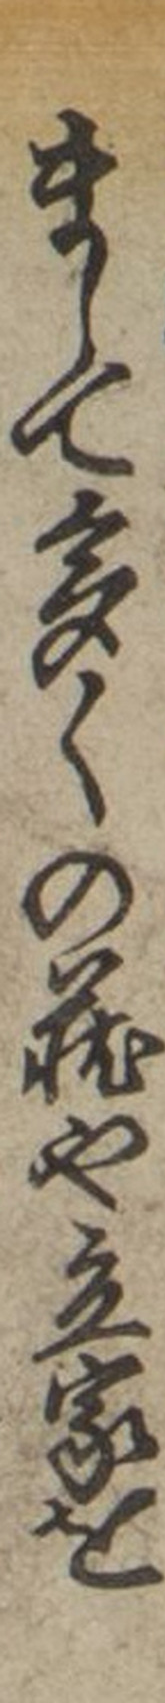まして多くの蔵や立家を
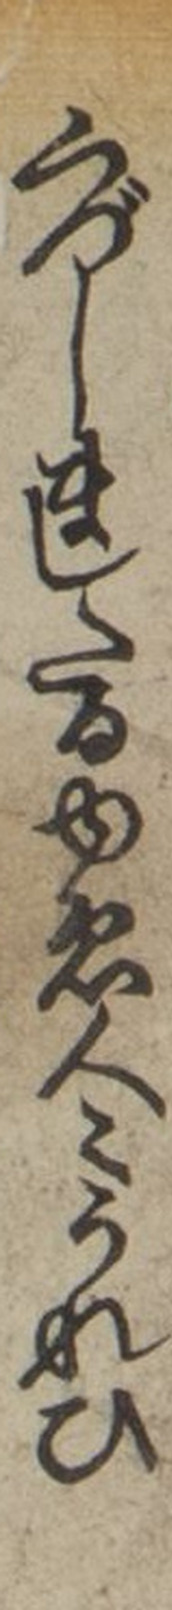くづしましたるゆゑ人々うれひ
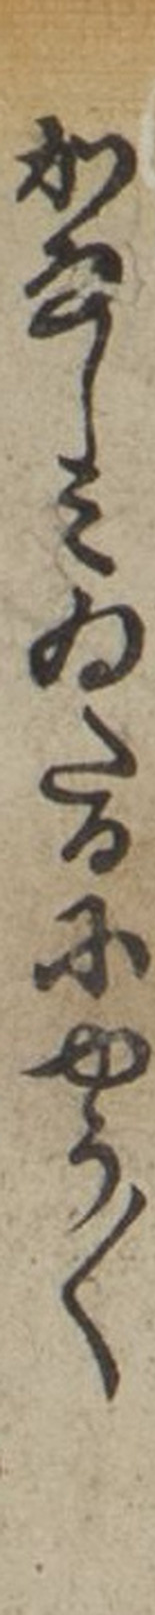かなしみゐたるにやう〳〵
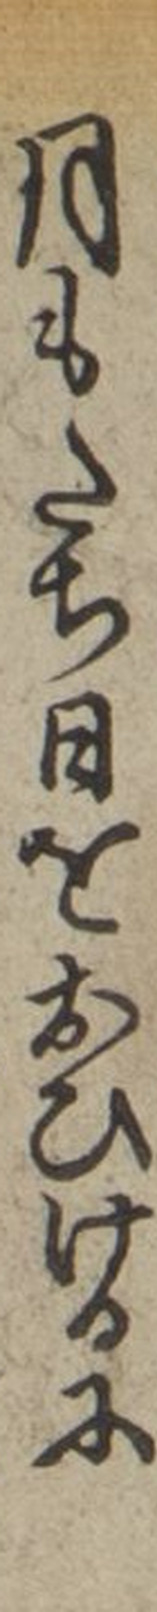月もたち日をおひけるに
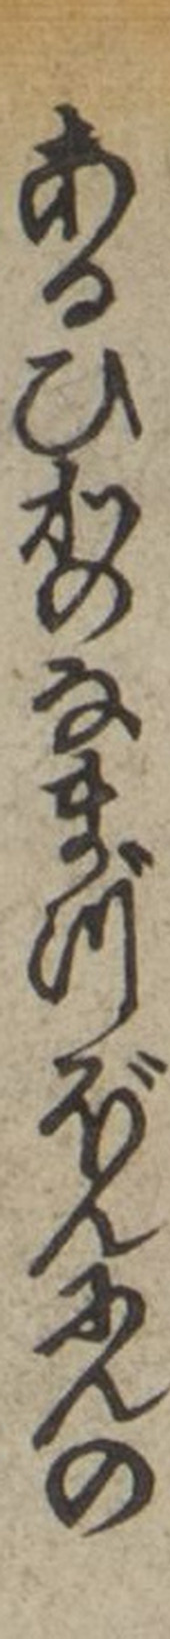あるひかのなまづぼんにんの
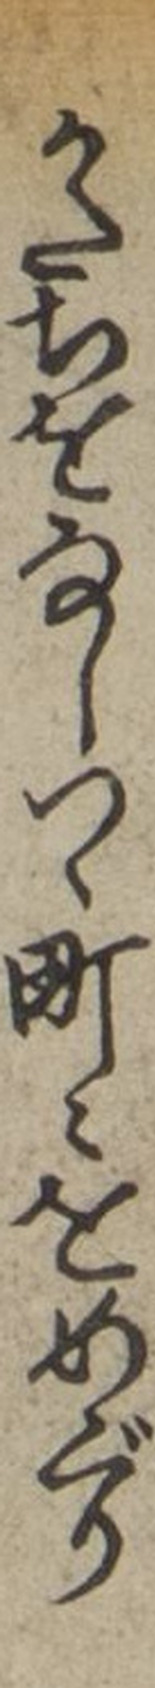かたちをなしつゝ町々をめぐり
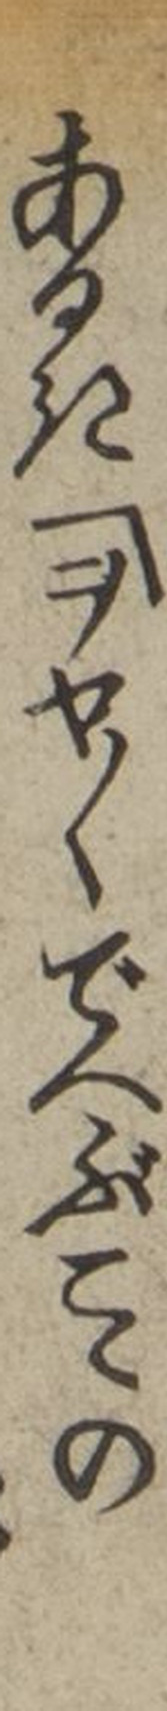あるき〽ヲヤ〳〵でへぶこゝの
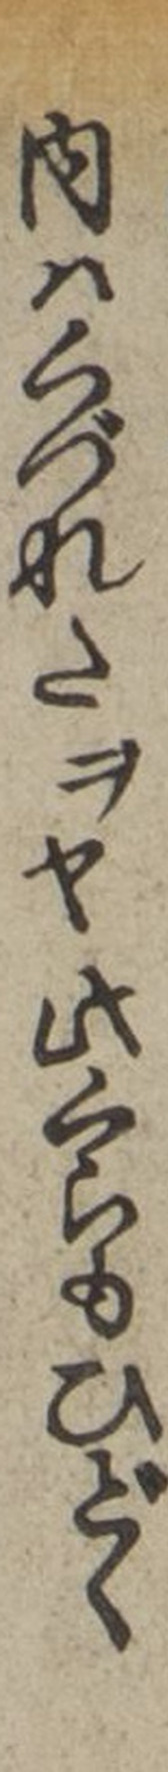内はくづれたヲヤ此くらもひどく
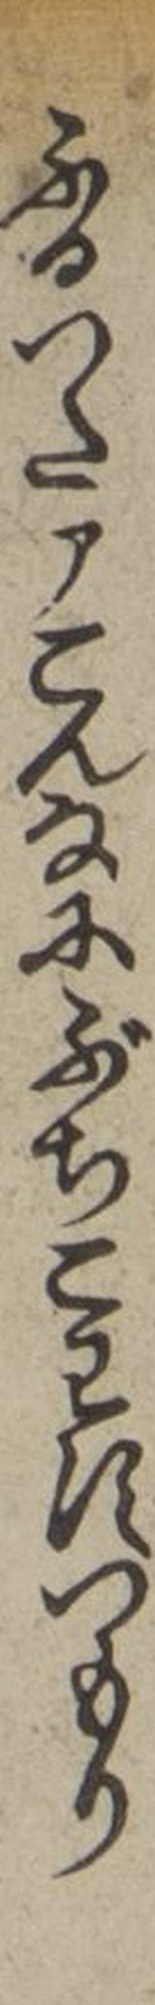ふるつたアこんなにぶちこわすつもり
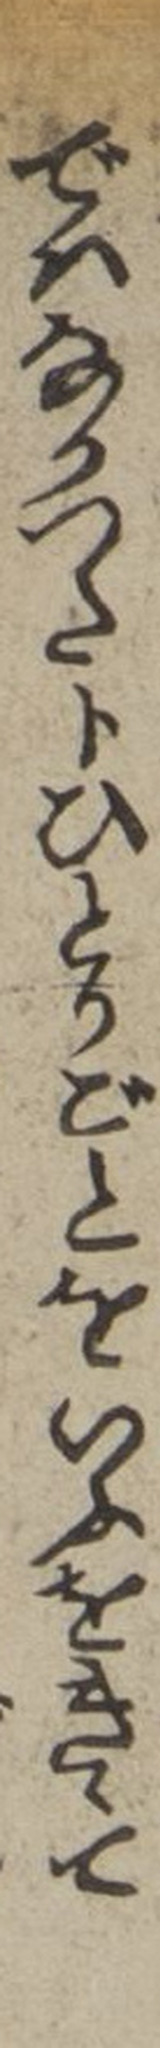ではなかつたトひとりごとをいふをきゝて
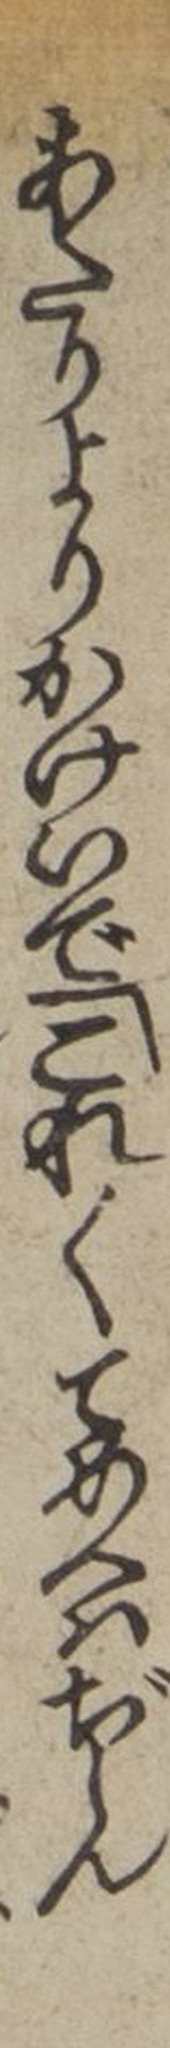あたりよりかけいで〽これ〳〵てめへはぢしん
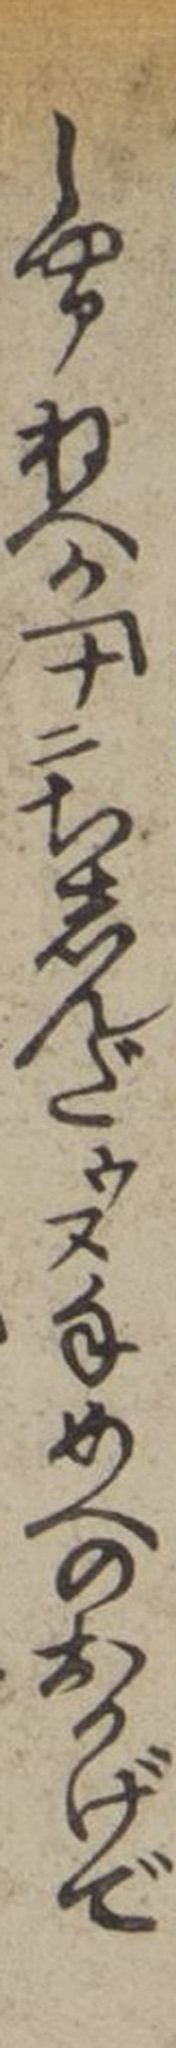しやァねへか〽ナニちしんだウヌ手めへのおかげで
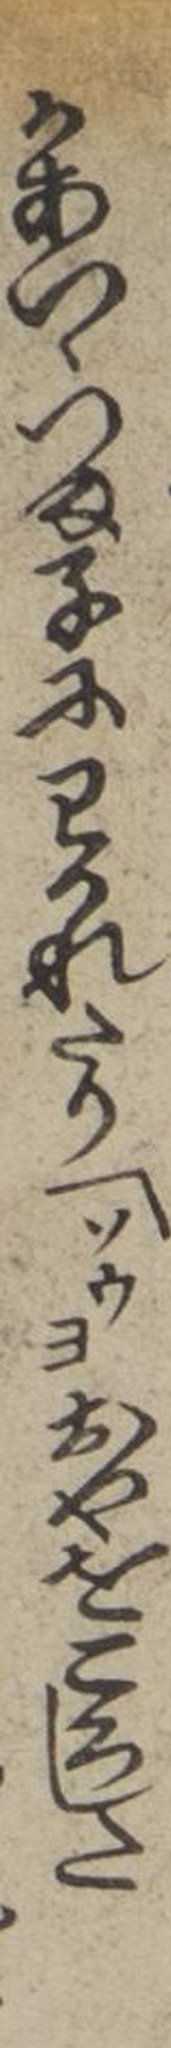かあいゝつま子にわかれたり〽ソウヨおやをころした
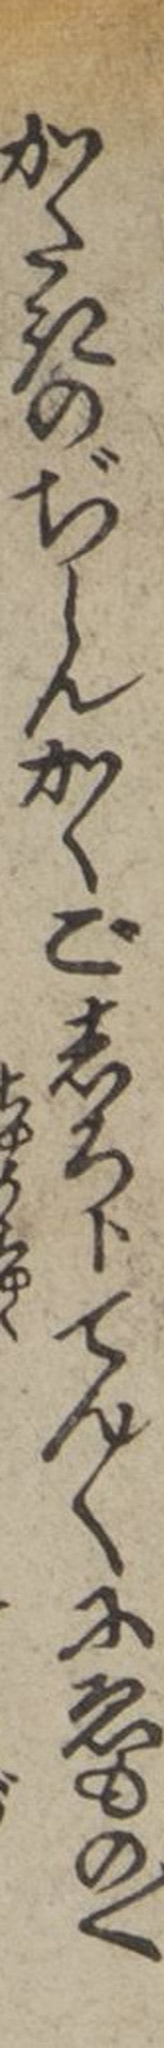かたきのぢしんかくごしろトてん〳〵にゑもの〳〵
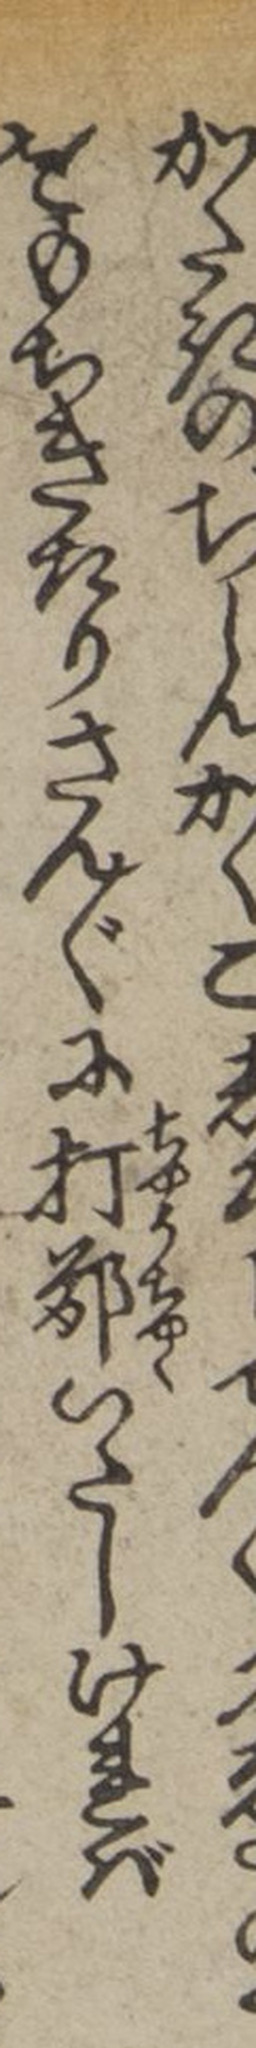をもちきたりさん〴〵に打擲いたしければ
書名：即席鯰はなし
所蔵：あいおいニッセイ同和損保株式会社
